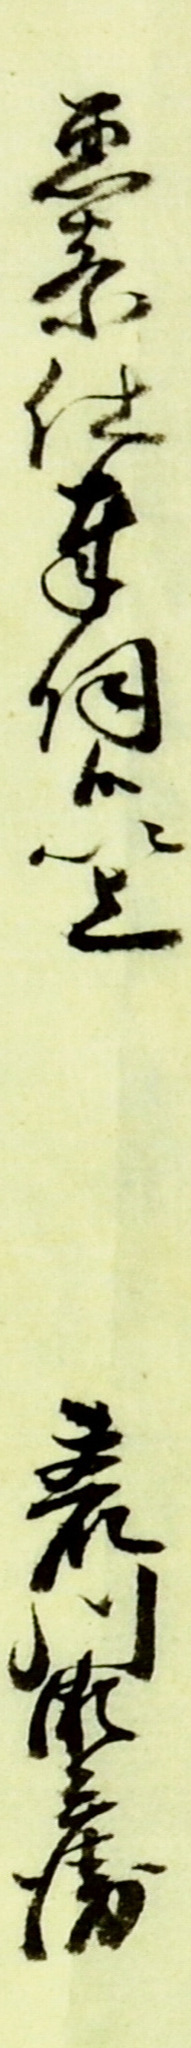悪素仕奉伺候以上荒川瀬兵衛
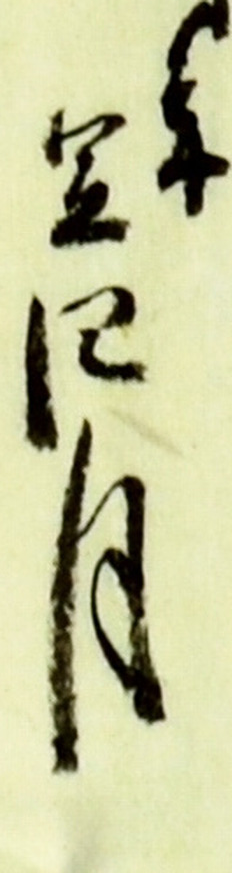閏四月

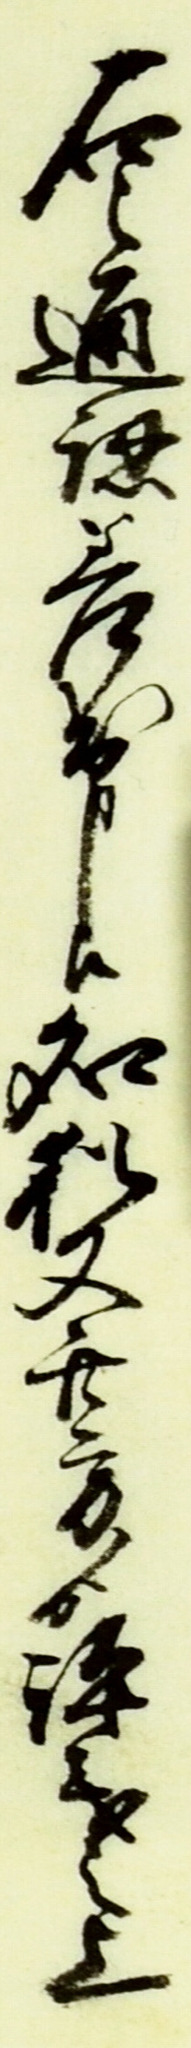右之通認差出申候処猶又此方ゟ評義之上
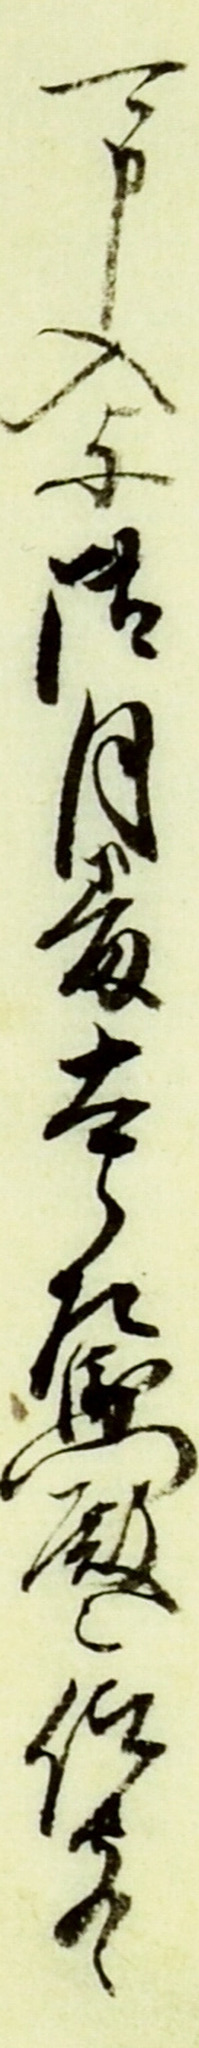可申入与御月番太郎左衛門殿被仰聞候
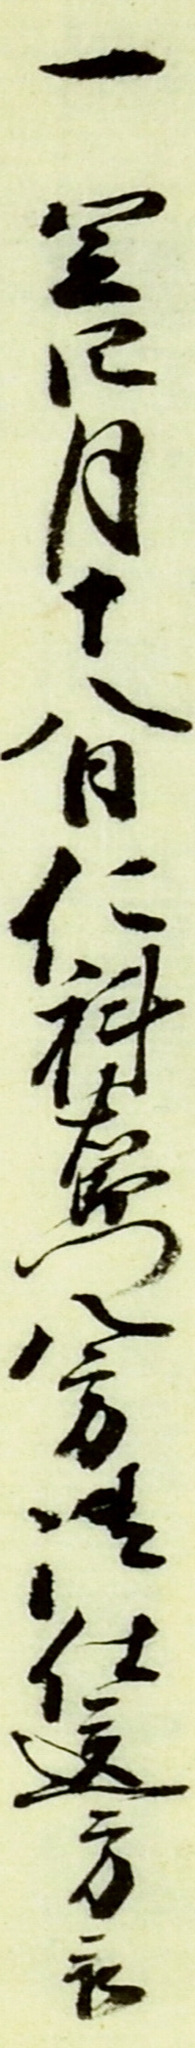一閏四月十八日仁科右衛門八方御仕送方被
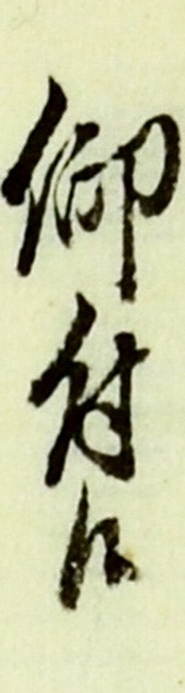仰付候
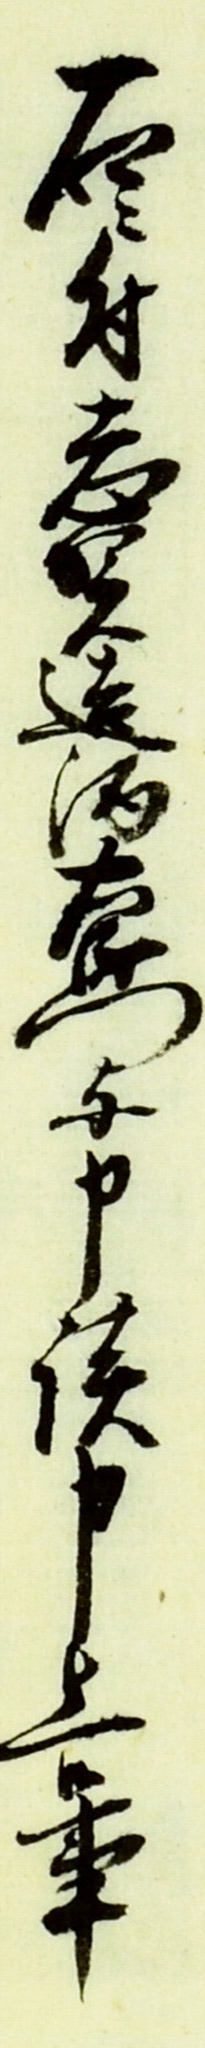右ニ付志賀造酒右衛門与申談申上候事
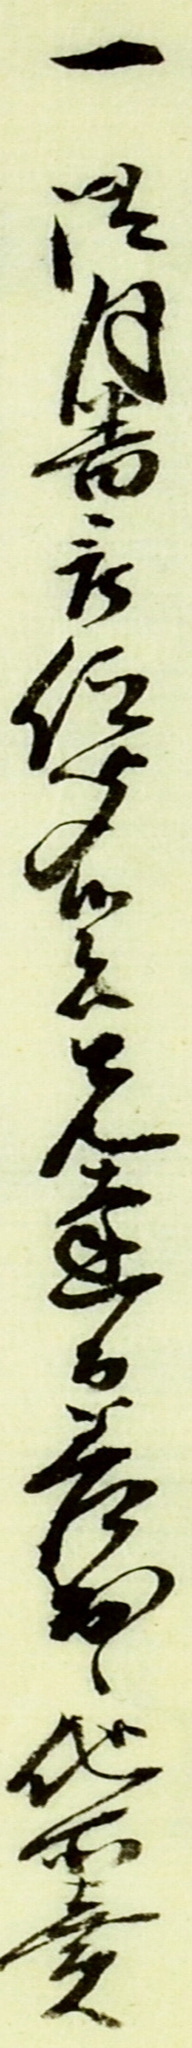一御月番被仰聞候者先達而差出候他所売
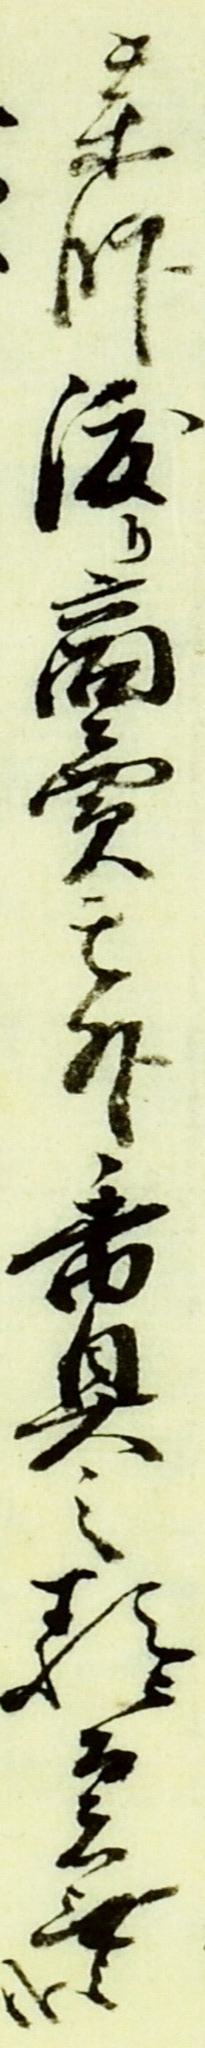薬師渡り商売其外香具之類ニ而無之候哉
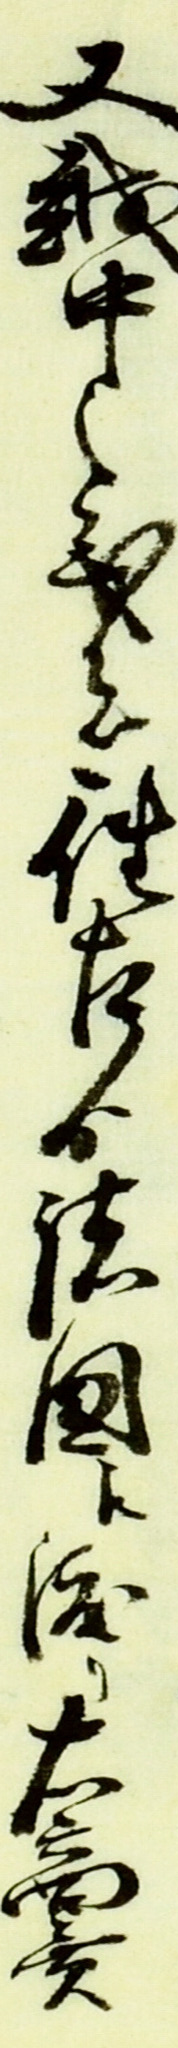又越中之義者往古ゟ諸国江渡り右商売
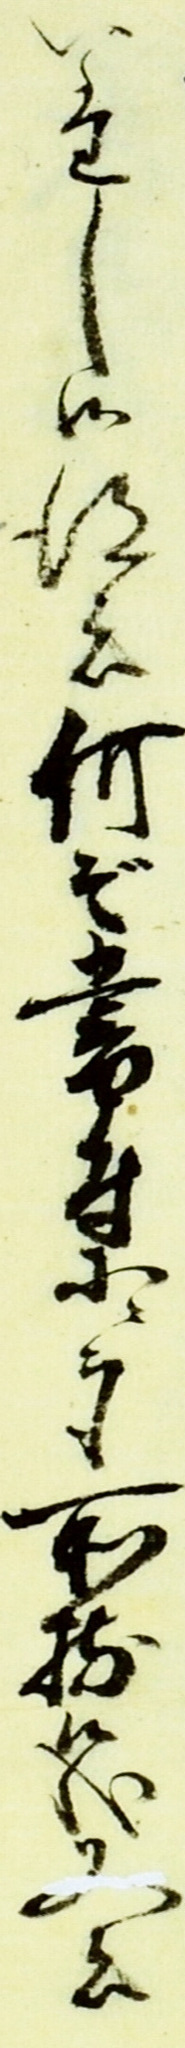いたし候得者何ぞ書付に候而も所持候哉又者
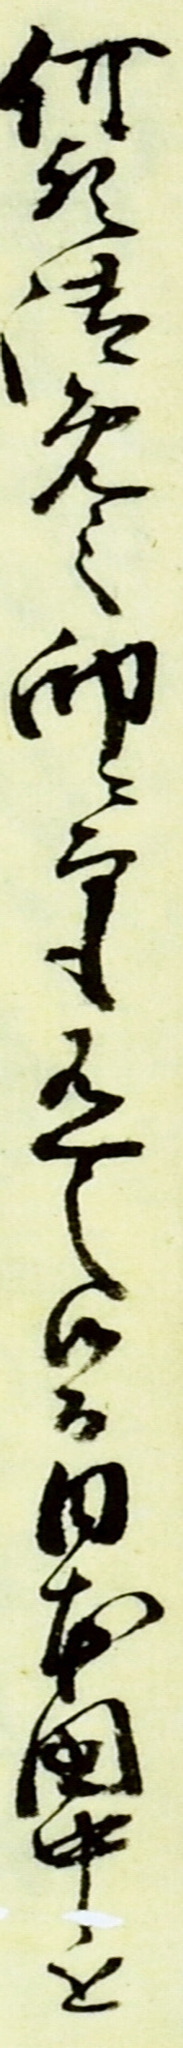何欤御免之印ニ而も有之候而日本国中を
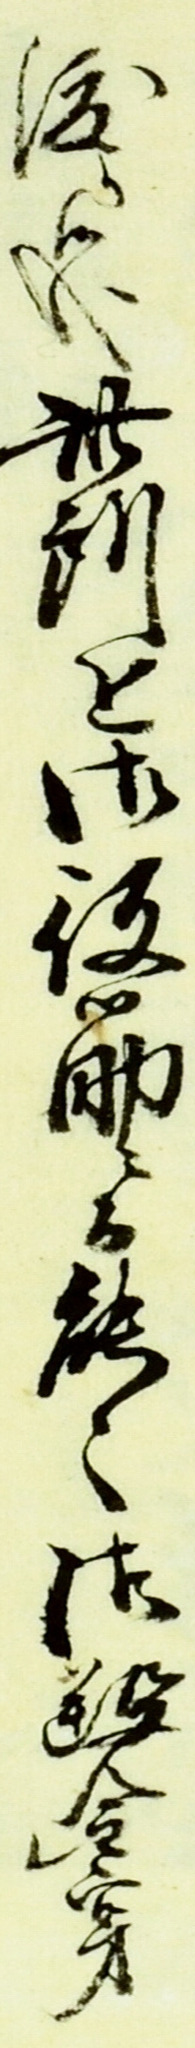渡り候哉此所を御役筋ニ而能々御鑿穿
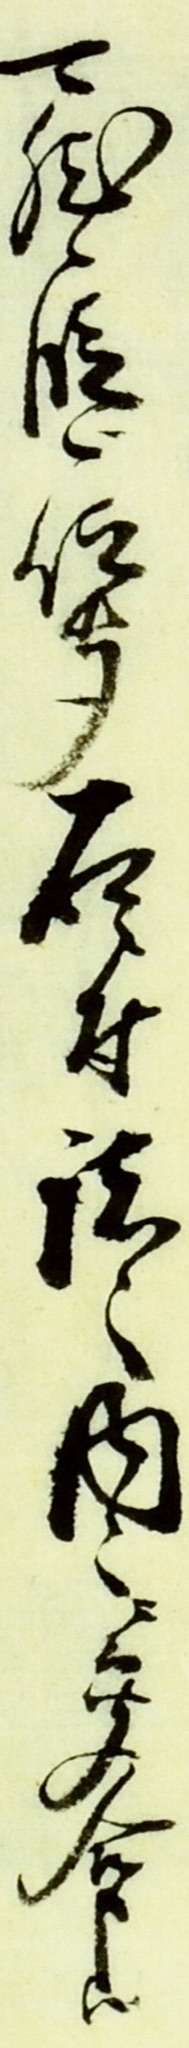可然候段仰聞右ニ付諸々内々ニ御聞合申候
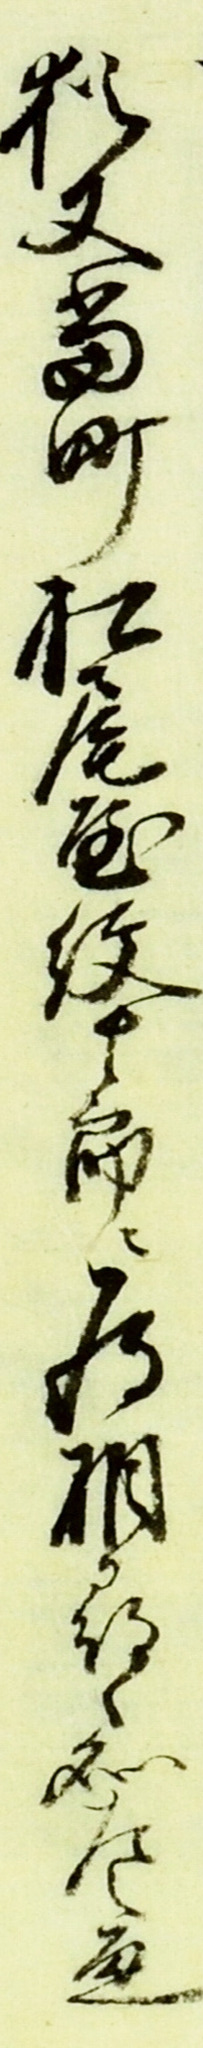猶又当町松尾屋紋十郎ニ為相尋候処左之通
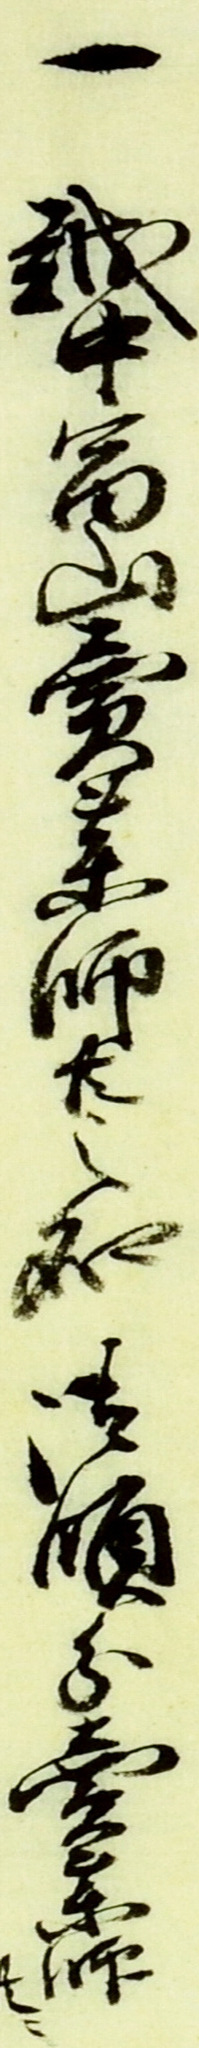一越中冨山売薬師共之処御領分売薬師共ニ
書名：他国賣薬師運上之事
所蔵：伊那市立高遠町図書館・合同会社AMANE
